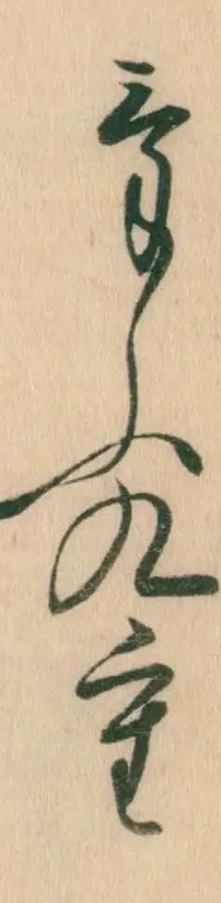けふ九重
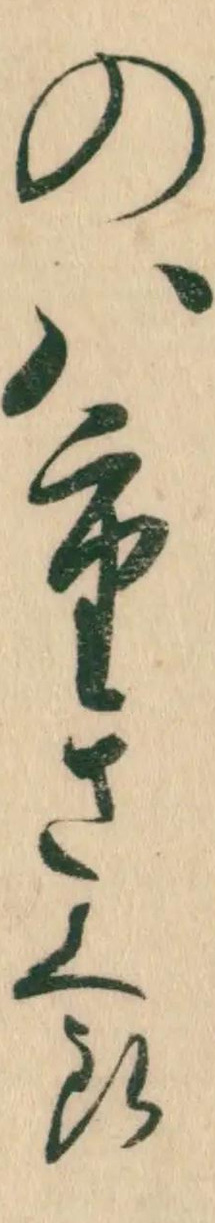の八重さくら
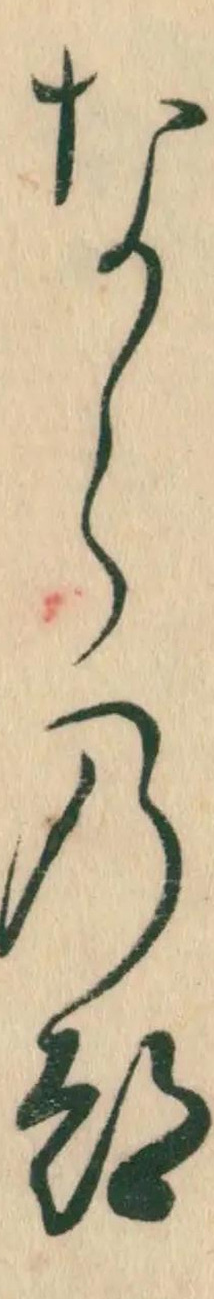ならの都
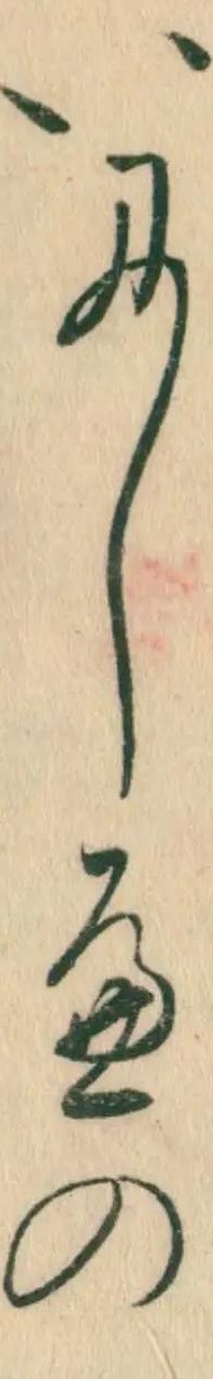いにしへの
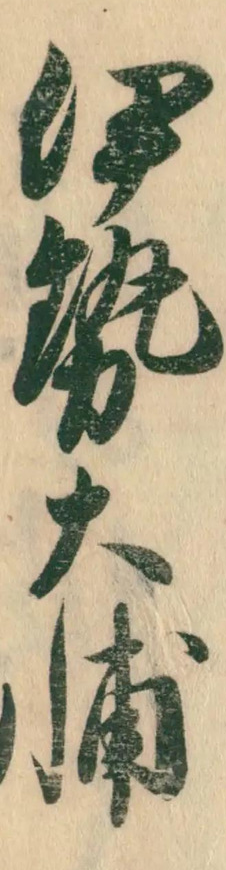伊勢大輔

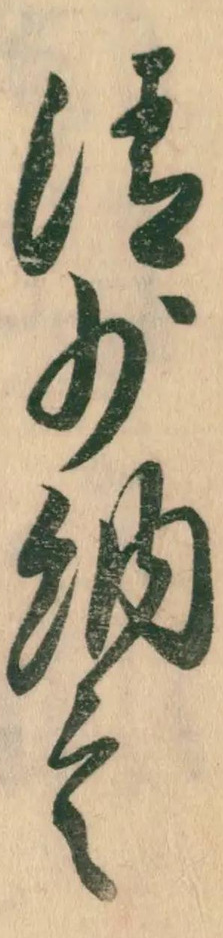清少納言
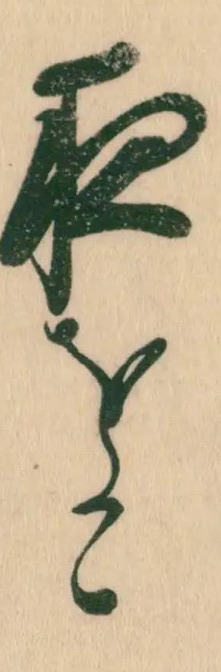夜をこ
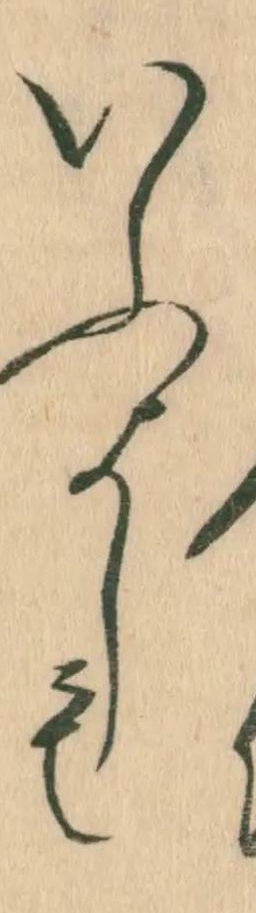いふよしも
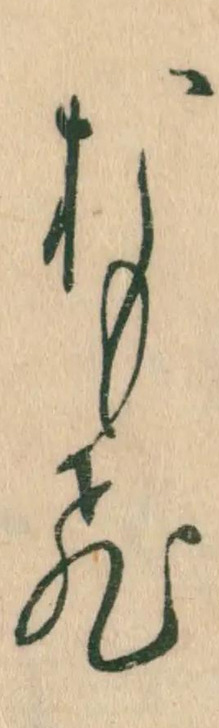おもひ

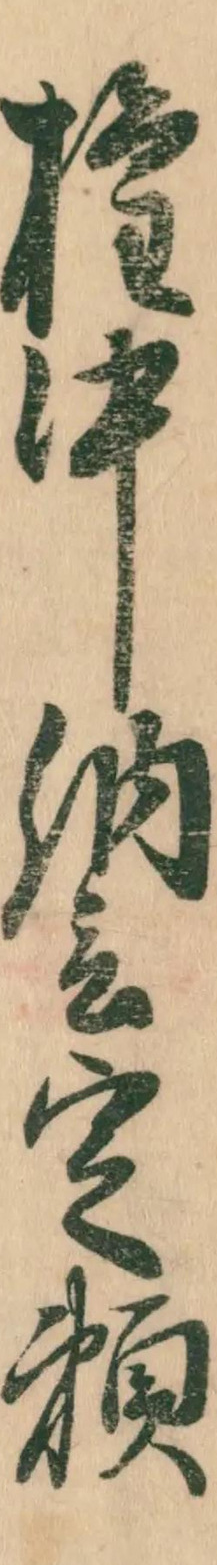權中納言定頼
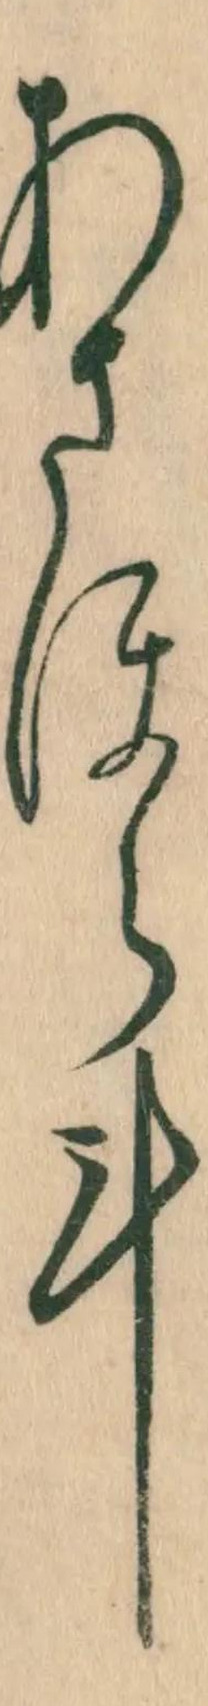あさほらけ
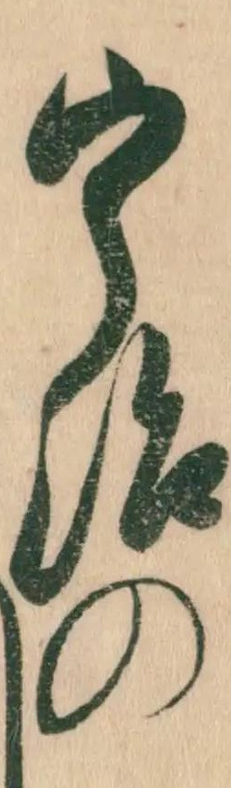宇治の
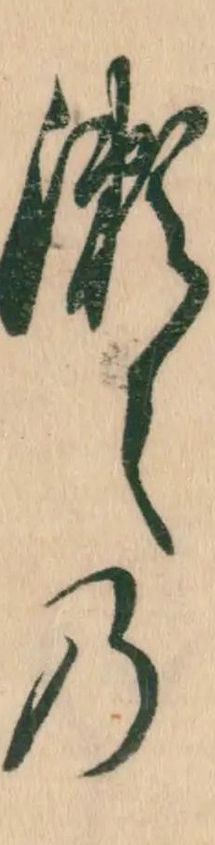瀬ゝの
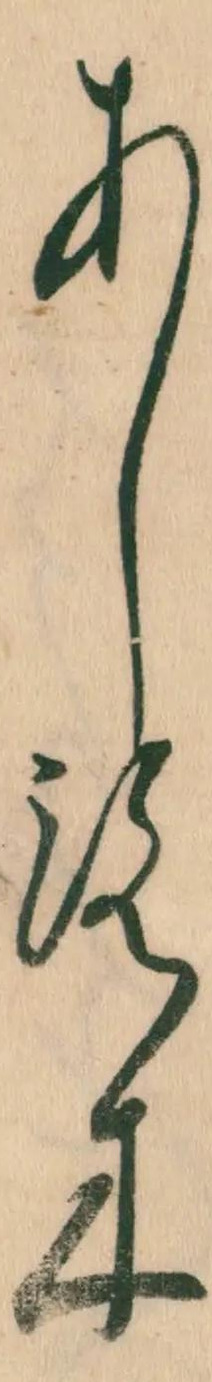あしろ木
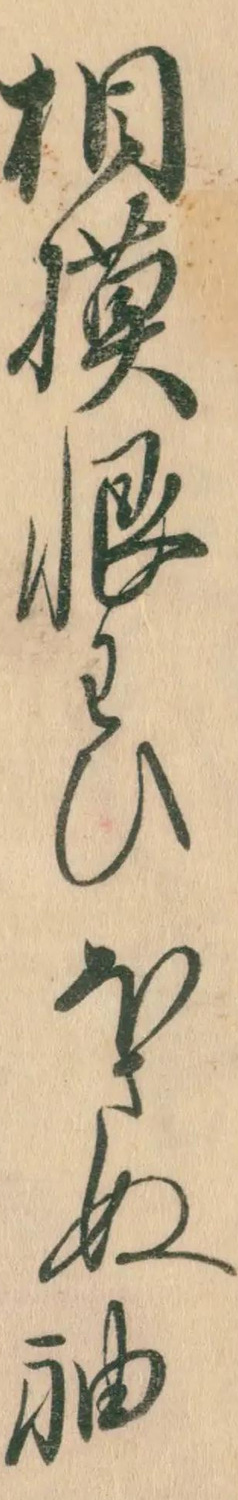相模恨わひほさぬ袖
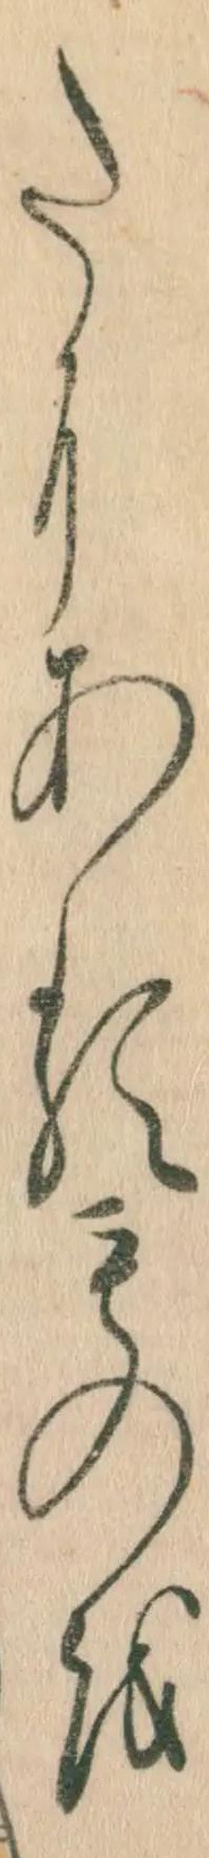たにあるものを
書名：錦百人一首あつま織
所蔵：国立国会図書館 National Diet Library, JAPAN
